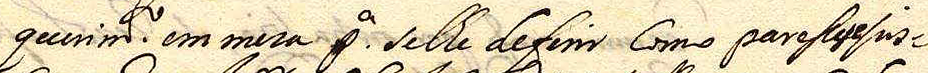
querim.to em meza p.a se lhe defenir Como paressese jus
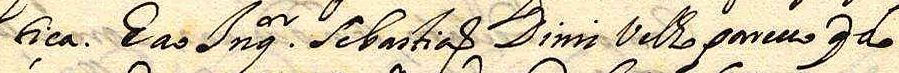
tiça. E ao Inqor. Sebastiaõ Dinis Velho pareceo q̄ do
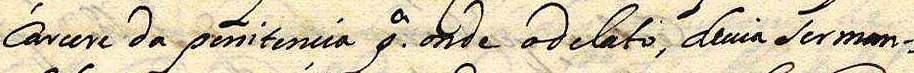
Carcere da penitençia p.a onde o delato, deuia ser man
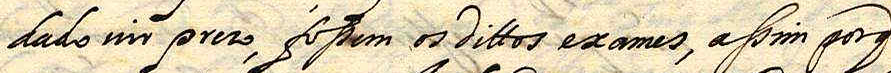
dado uir prezo, fossem os dittos exames, assim porq̄
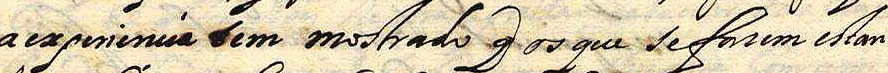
a experiençia tem mostrado q̄ os que se fazem estan
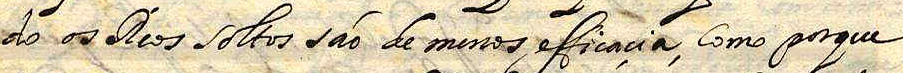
do os Réos soltos são de menos efficaçia, Como porque
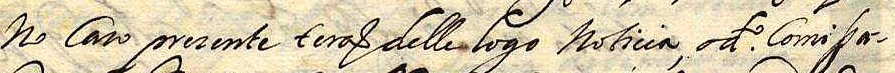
no Cazo prezente teraõ delle logo notiçia, o d̄.o Comissa
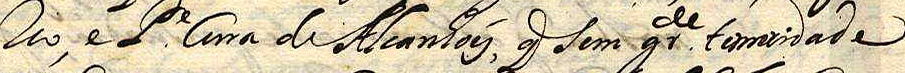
Rio, e P.e Cura de Alcanhões, q̄ sem grde. temeridade
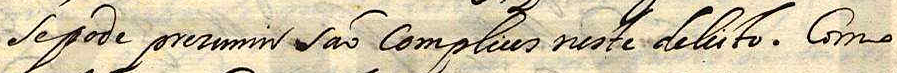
se pode prezumir são Complices neste delicto. Como
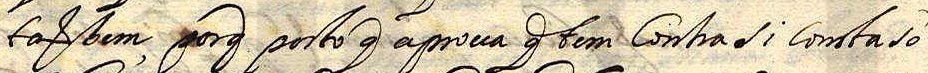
taõ bem, porq̄ posto q̄ a proua q̄ tem Contra si Consta só
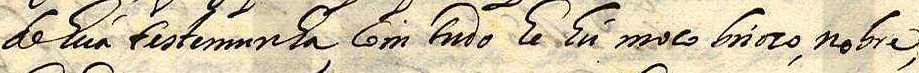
de huā testemunha, Comtudo he hū moco briozo, nobre,
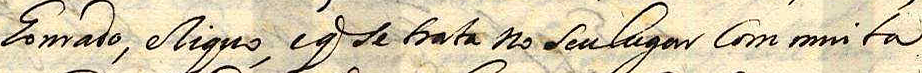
honrado, e Riquo, e q̄ se trata no seu lugar Com muita
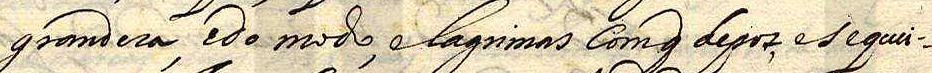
grandeza, e o modo, e lagrimas Com q̄ depoz, e se quei
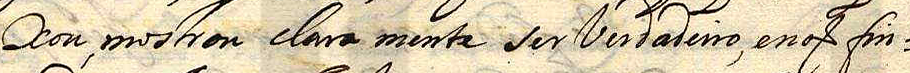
xou, mostrou claramente ser verdadeiro, e naõ fin
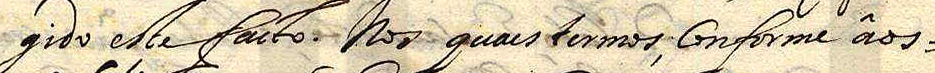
gido este facto. Nos quaes termos, Conforme âos
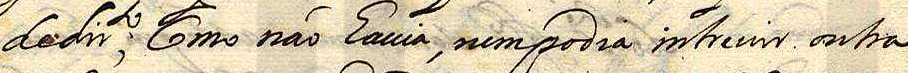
de dir.to, Como não hauia, nem podia intreuir outra
